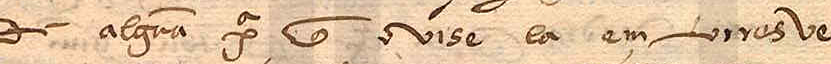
de algūa pa q̄ o vise la em torres ve
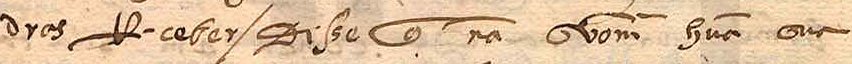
dras Receber / disse q̄ n̄a soomte hūa sua
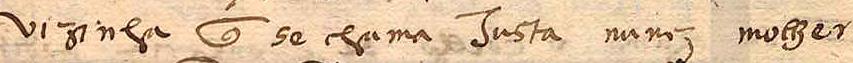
vizinha q̄ se chama Justa nunez molher
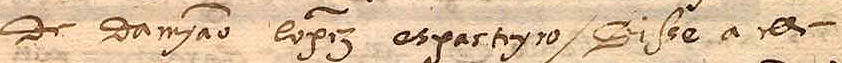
de damyão lopez esparteyro / disse a elle
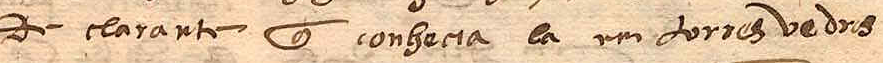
declarante q̄ conhecia la em torres vedras
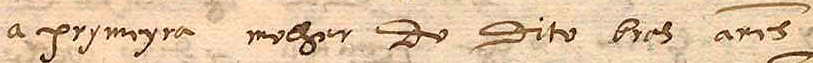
a prymeyra molher do dito bras ānes
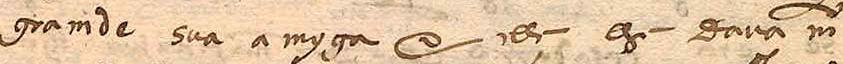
gramde sua amyga e elle lhe daua mto
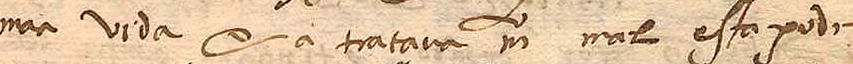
maa vida e a trataua mto mal esta pode
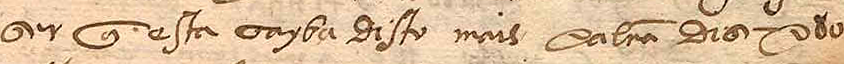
ser q̄ esta sayba disto mais e alnā dise e do
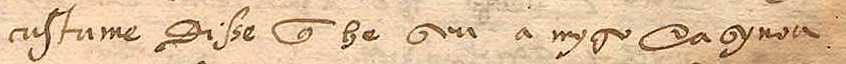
custume disse q̄ he seu amygo e asynou
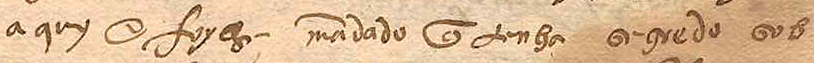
aquy e foylhe m̄adado q̄ tenha segredo sob
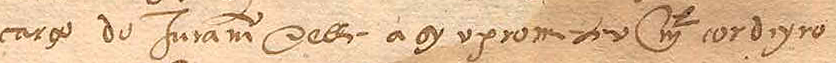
cargo do Juramto e elle asy o prometeo mel cordeyro
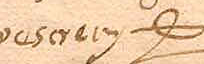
o escreuy
